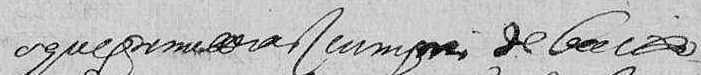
o que prometteraõ cumprir debaixo
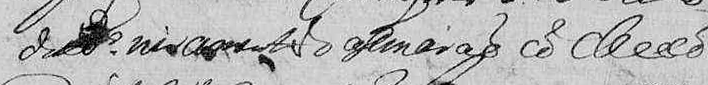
do do. iuramento e assinaraõ cō elle cō
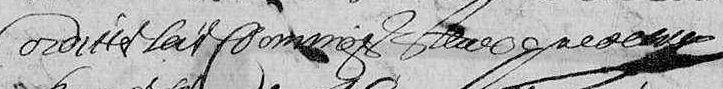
os dittos saõ Domingos esteues que o esuy
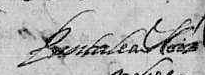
Pantaleaõ Roiz̄
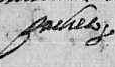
pacheco
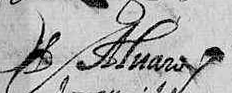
D Aluaro
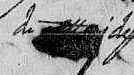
de attajde
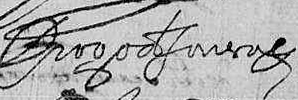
Diogo d̄ sousa
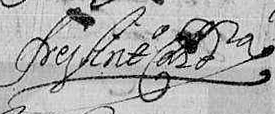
Frey Anto Caldra
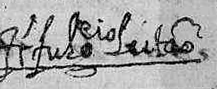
fr̄ fulgcio Leitaõ
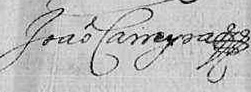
Joaõ Carreyra
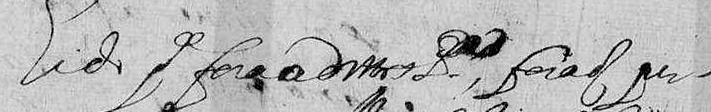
E ido pa fora os dittos s.res, foraõ per
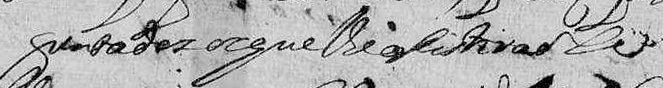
guntados os que lhe assistiraõ e
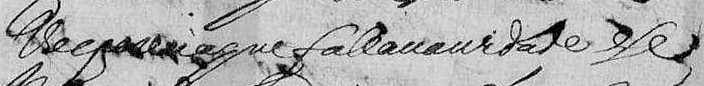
lhe parecia que fallaua uerdade e se
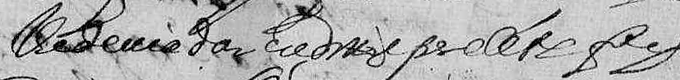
lhe deuia dar creditto e por ele ta foe q̄
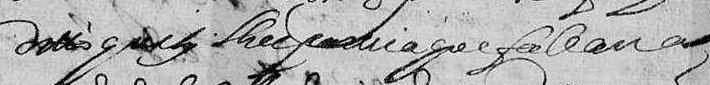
ditto que sj lhe parecia que fallaua
